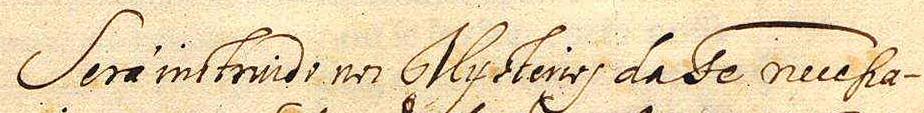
Será instruido nos Mysterios da Fe necessa
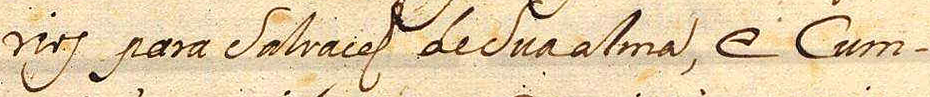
rios para Salvaçaõ de Sua alma, e Cum
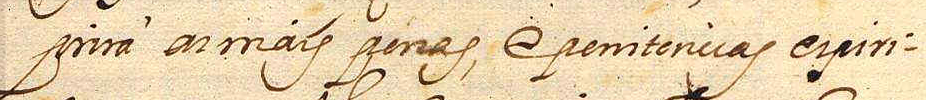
prirá as mais penas, e penitencias espiri
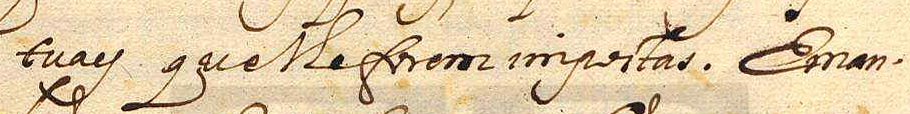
tuaes que lhe forem impostas. E man
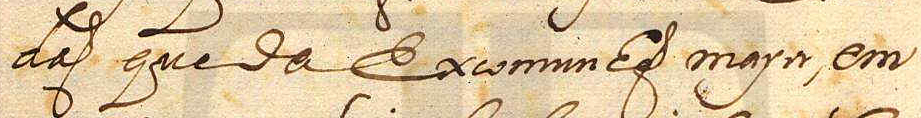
daõ que da Excomunhaõ mayor, em
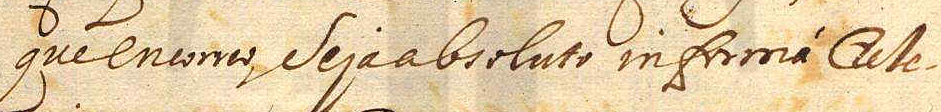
que encorreo, Seja absoluto in formá Æcle
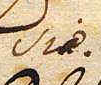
siæ.
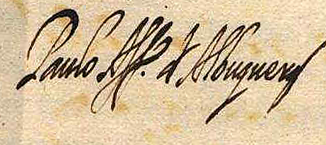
Paulo Aff.o de Albuquerq̄
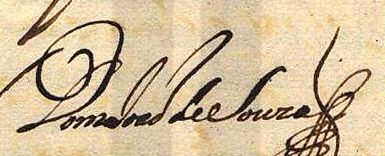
Dom Ioaõ de Souza
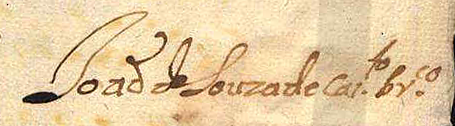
Ioaõ de Souza de cas.to br.co
